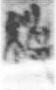紳（靷）
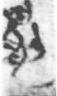○（貂）
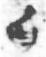首
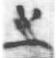之
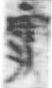○（蒙）
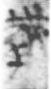○（鞁）
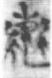○（轡）
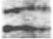二
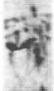○（秦）
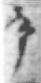弓
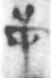矢
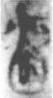○（箙）
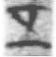五
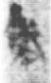秉
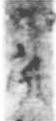○（殿）
